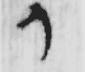人
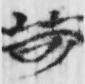苛
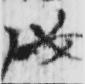戊
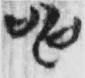申
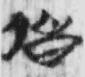俈
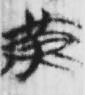黃
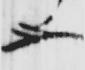之
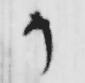人
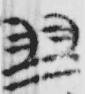翏
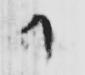人
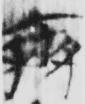秦
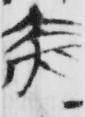赤
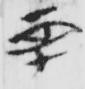辛
